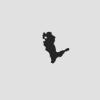曰
